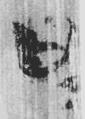口
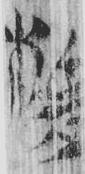檻（鑑）
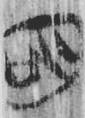名（銘）
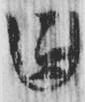曰
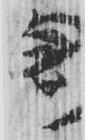見
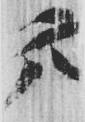亓（其）
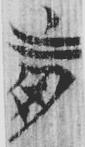前
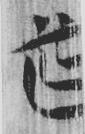必
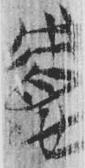慮
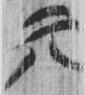亓（其）
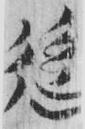後
